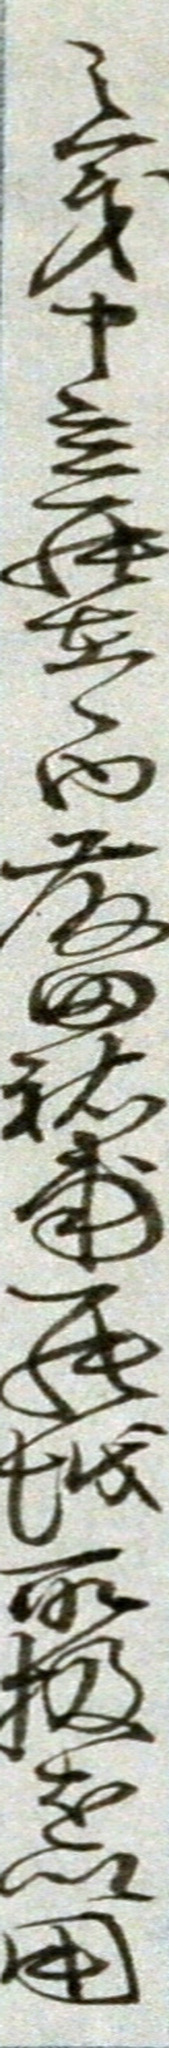之義申立罷在候内藤田祐甫罷越取扱を以用
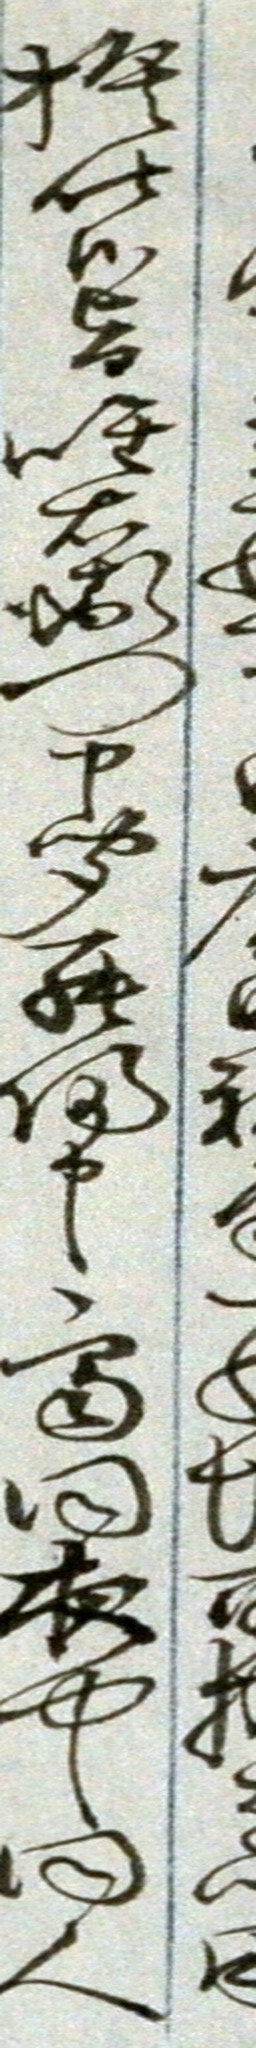捨仕候旨唯右衛門申聞罷帰申候間同夜中同人
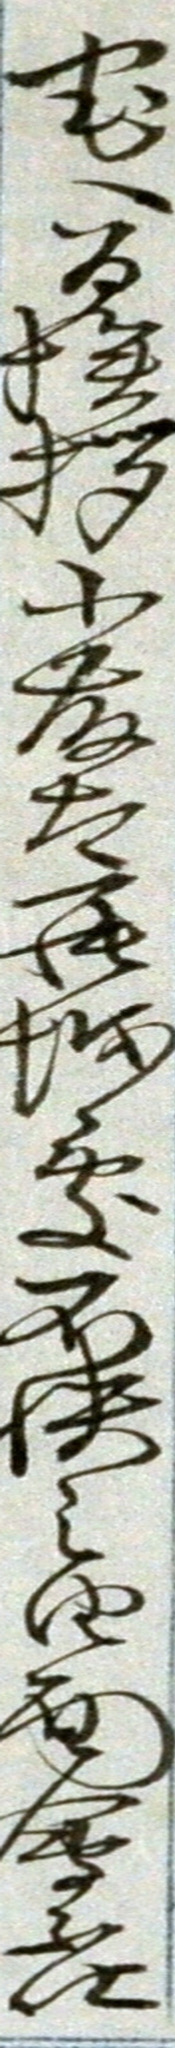宅へ為挨拶小藤太罷越候處不快之由面会不仕
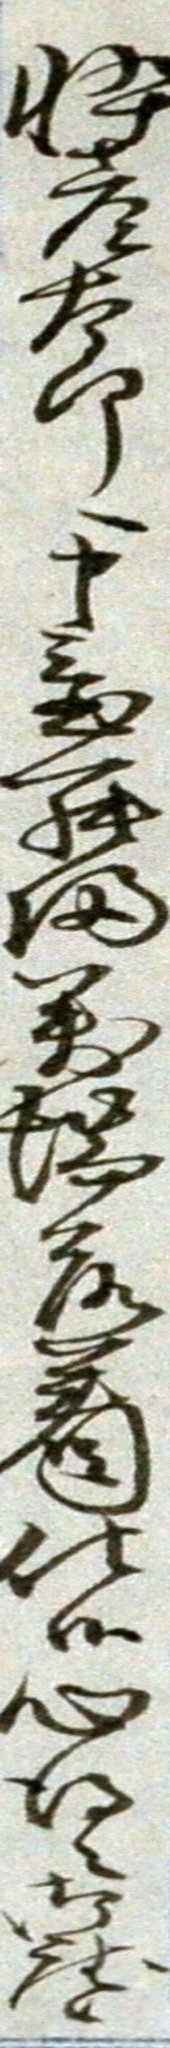忰彦太郎へ申置罷帰萬端落着仕候心得ニ御座候
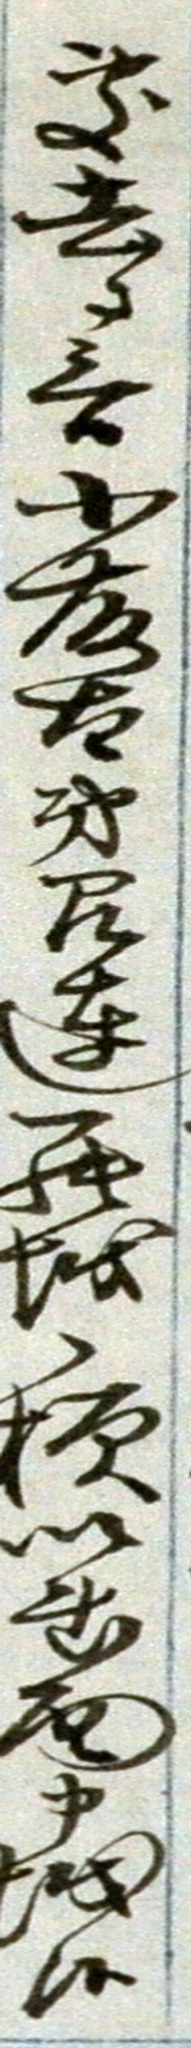處去る三日小藤太弟召連罷越候様以書面申越候
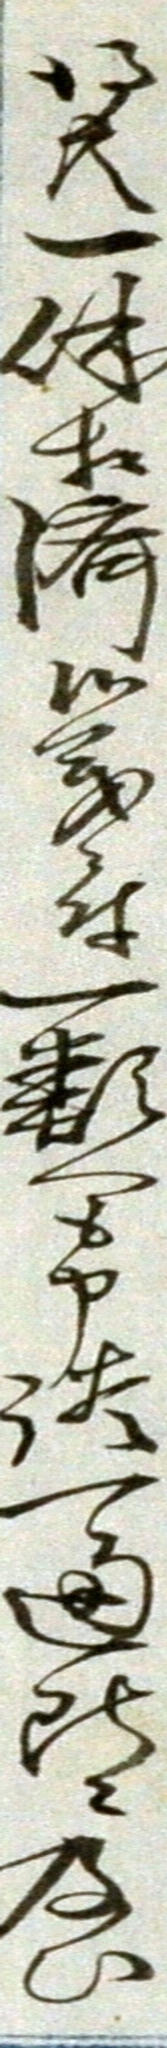得共一体相済候義ニ付一類へも申談一通断ニ及ひ
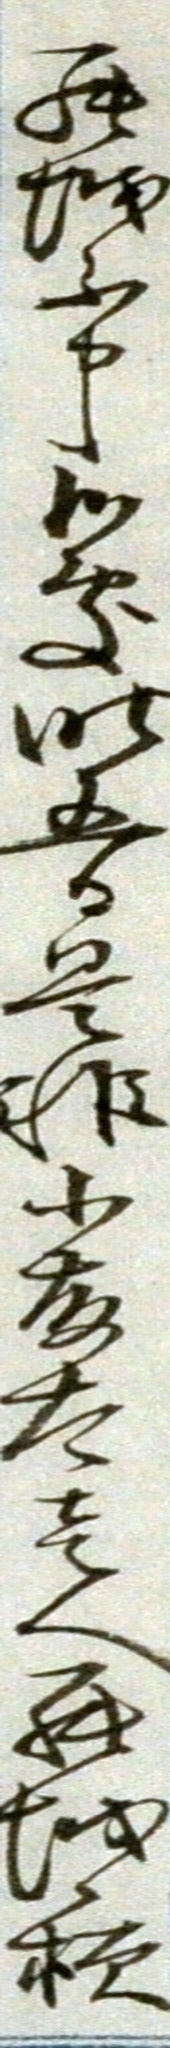罷越不申候處昨五日是非小藤太壱人罷越候様
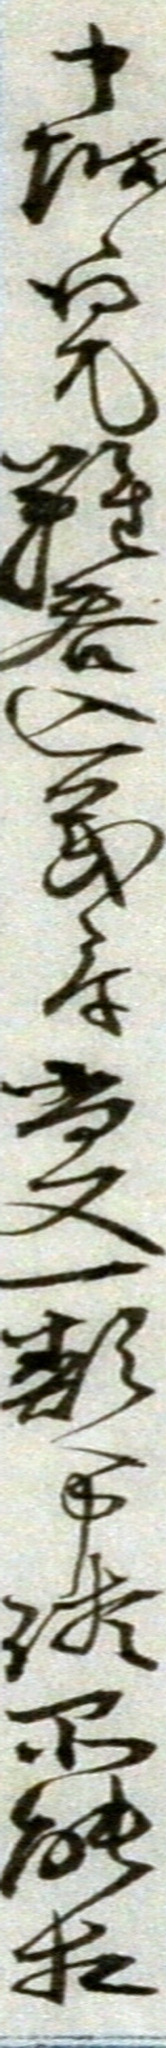申越候得共難吞込義ニ付尚又一類へ申談品能相
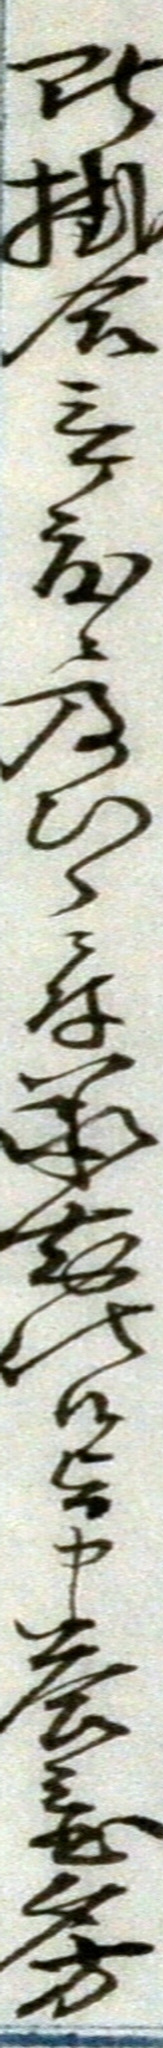断掛合三ヶ度ニ及ひ候ニ付承知仕候旨申答置夕方
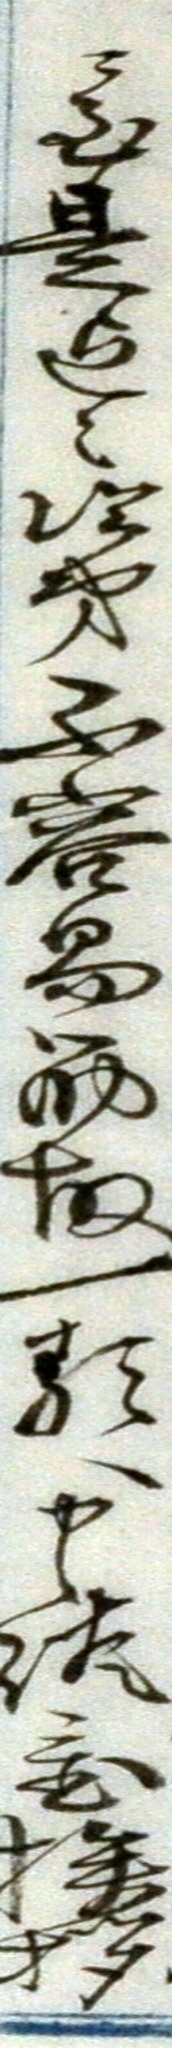ニ至是迄之次第不容易筋故一類へ申談置挨拶
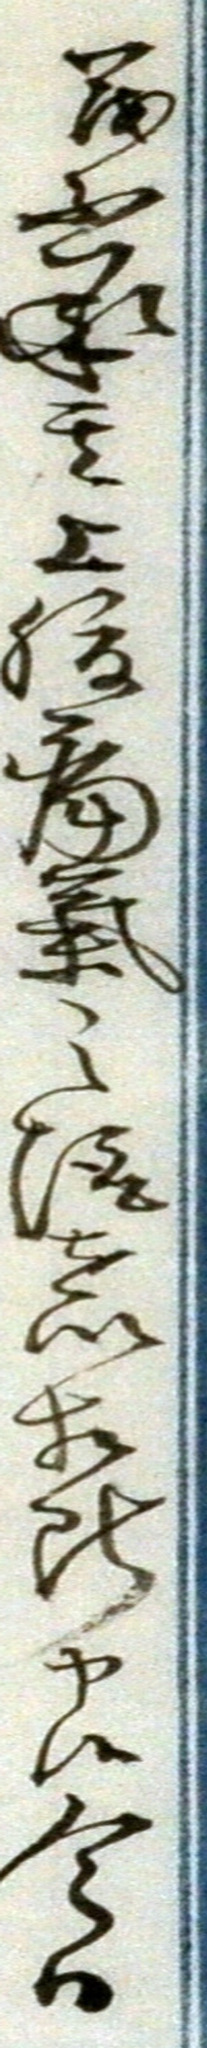茂不承其上腹痛気之趣を以相断申候今日
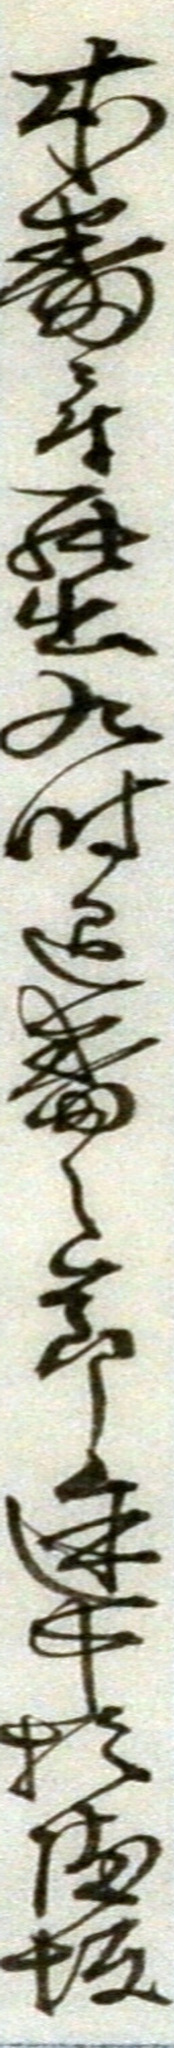本番ニ付罷出九時退番之節途中於殿坂
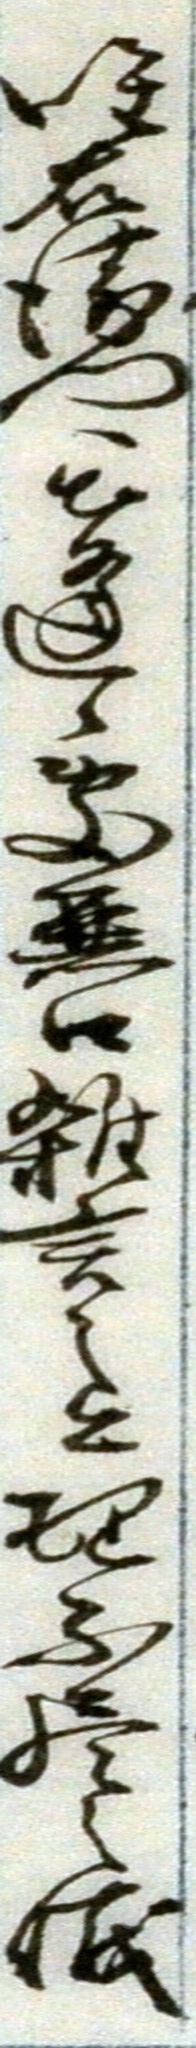唯右衛門へ出逢候處悪口雑言之上理不尽之儀
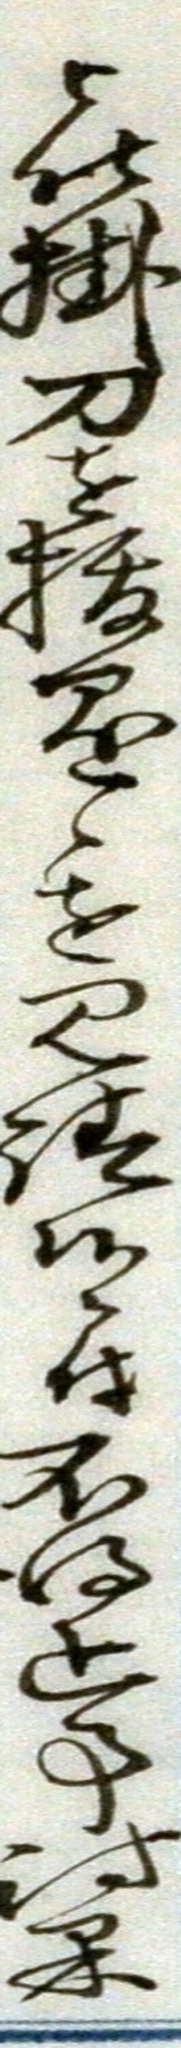被仕掛刀を抜懸候を見請候ニ付不得止事討果
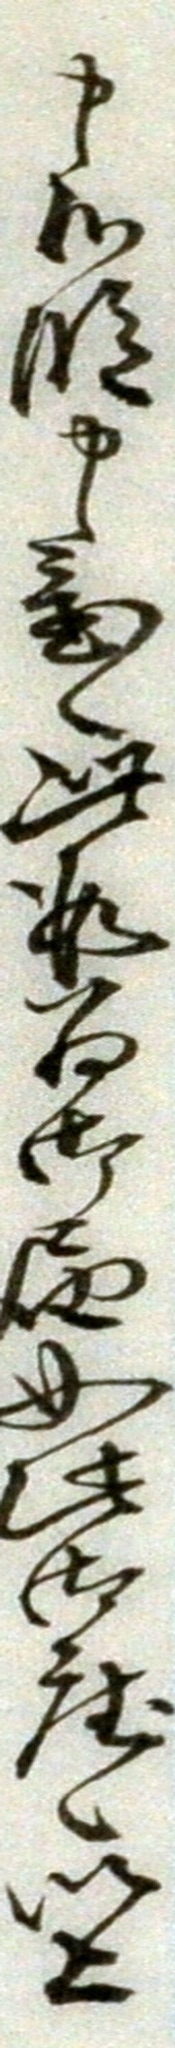申候段申置候此段為御届如此御座候以上
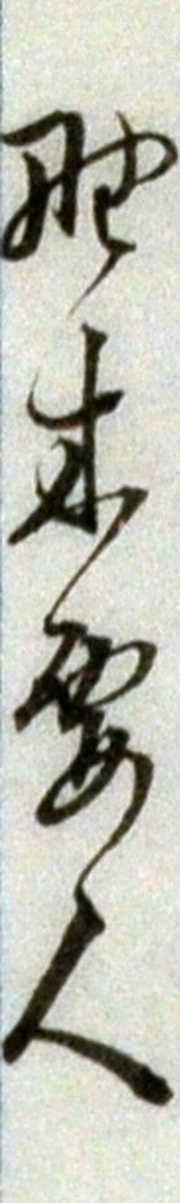野木要人
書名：川面小藤太子細有之多賀谷唯右衛門ヲ打果候一件
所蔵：伊那市立高遠町図書館・合同会社AMANE
